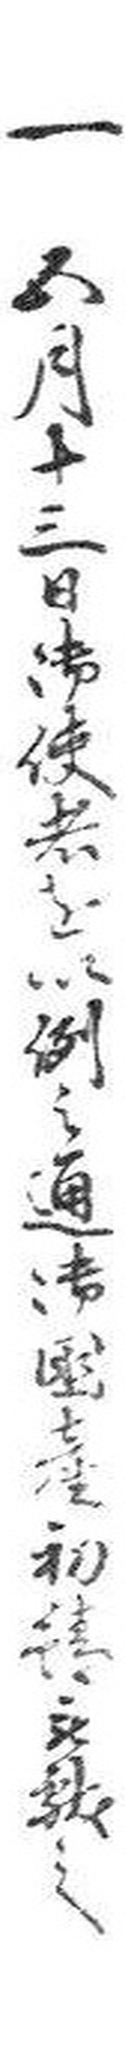一五月十三日御使者を以例之通御国産初鯖被献之
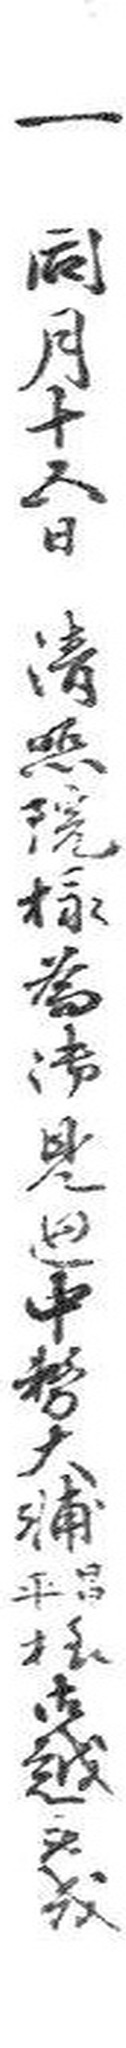一同月十五日清照院様為御見廻中務大輔昌平様御越被成
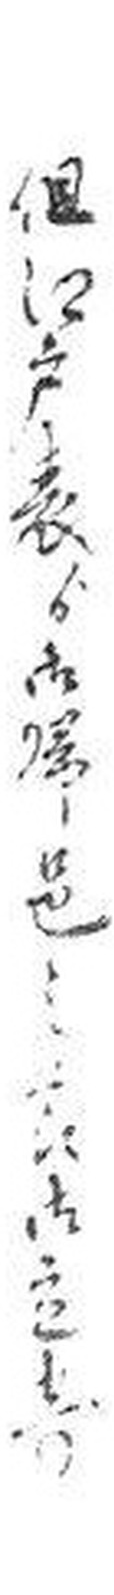但江戸表ゟ御帰邑之節御立寄
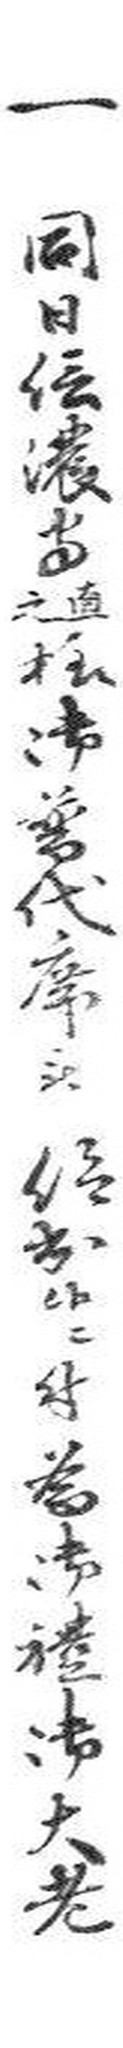一同日信濃守直之様御譜代席被仰出候ニ付為御礼御大老
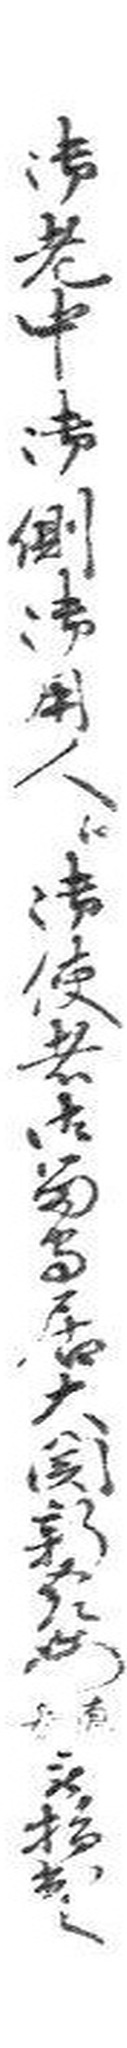御老中御側御用人江御使者御留守居大関新五左衛門直看被指出之
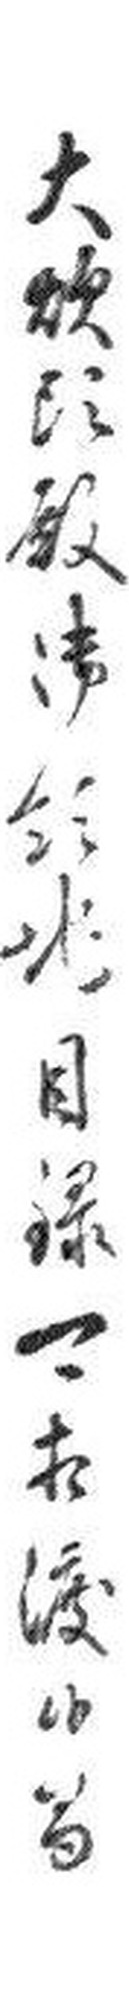大炊頭殿御領地目録可相渡候間
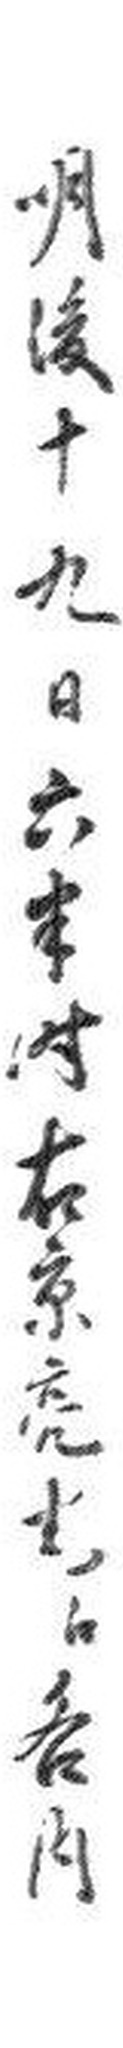明後十九日六半時右京亮宅江各内
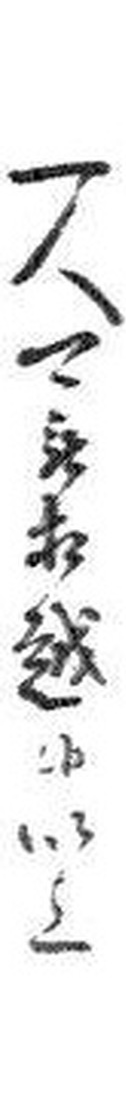一人可被相越候以上
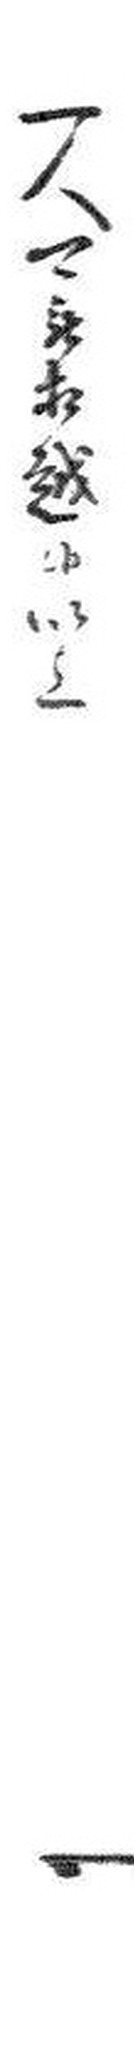一人可被相越候以上
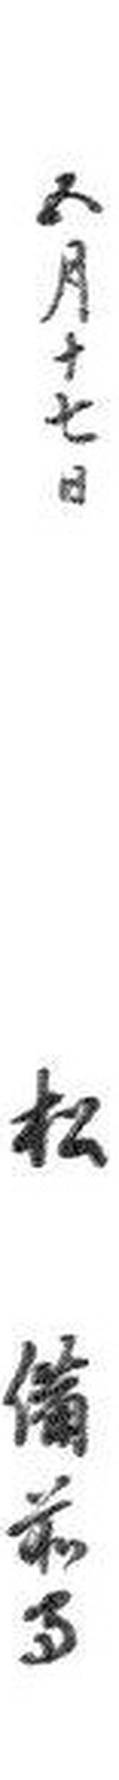五月十七日松備前守
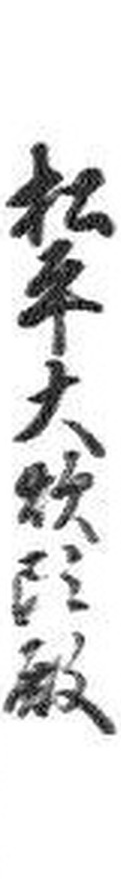松平大炊頭殿
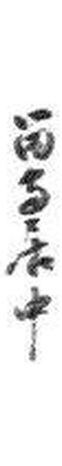留守居中
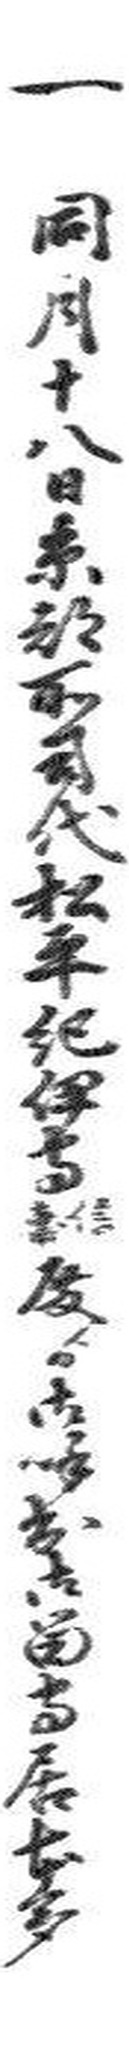一同月十八日京都所司代松平紀伊之信庸殿ゟ御呼出御留守居本多
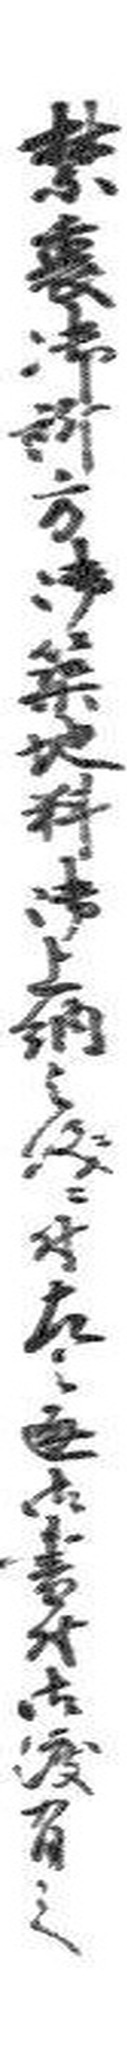禁裏御所方御築地料御上納之儀ニ付左之通御書付御渡有之

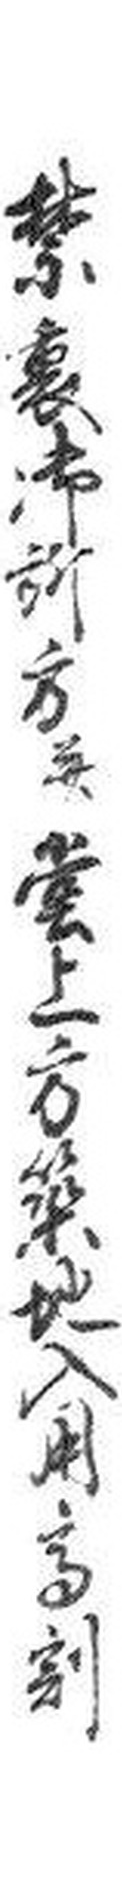禁裏御所方并堂上方築地入用高割
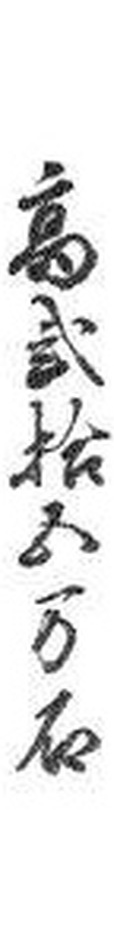高弐拾五万石
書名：家譜 二十九 吉邦公 従正徳二年到正徳三年
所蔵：福井県文書館 Fukui Prefectural Archives
